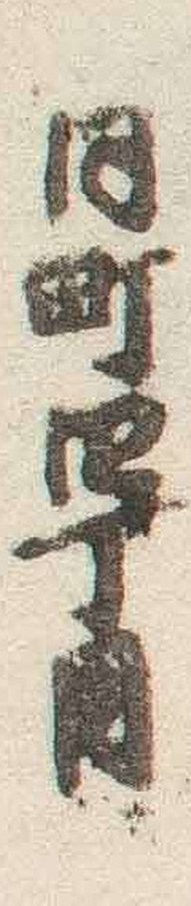同町四丁目

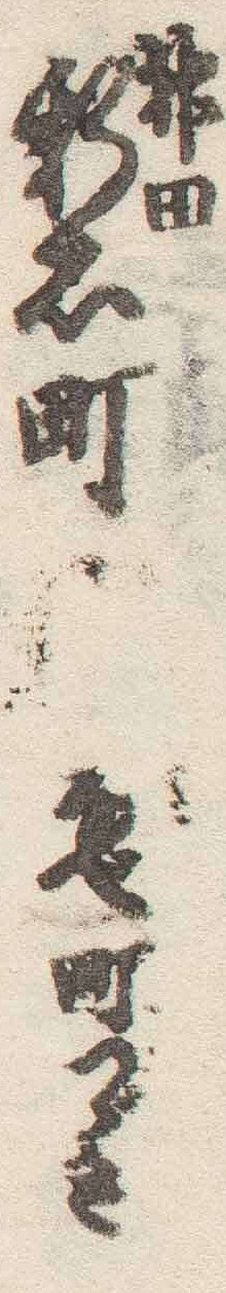新石町なべ町つゞき
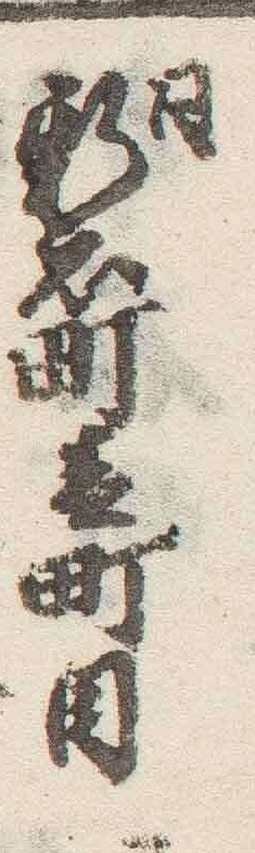新石町壱町目
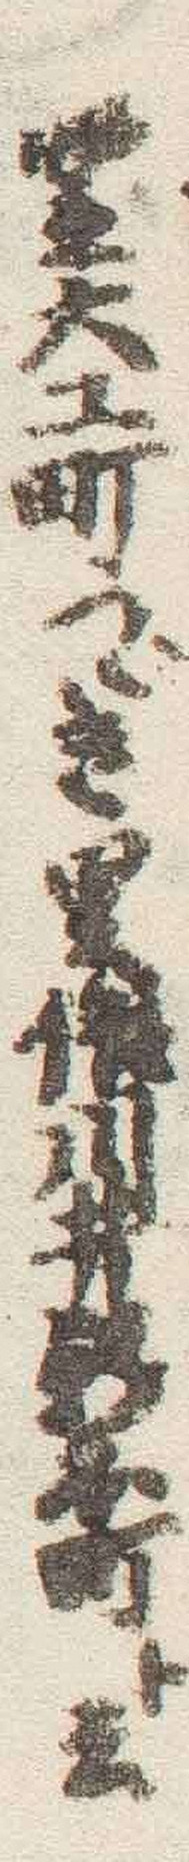竪大工町つゞき里俗川井新石町ト云
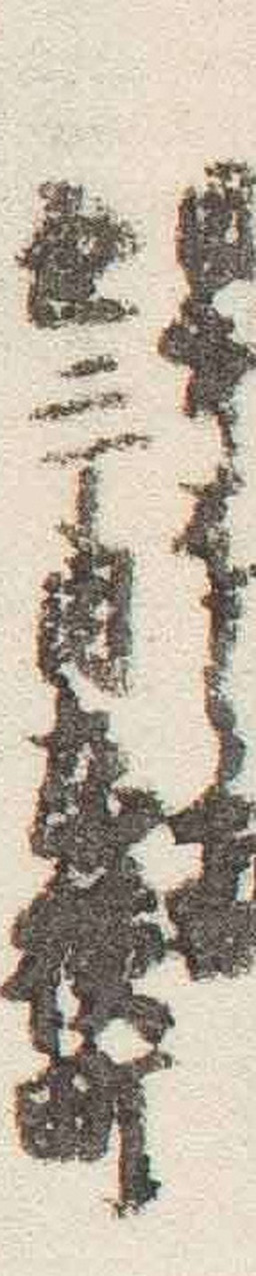通二丁目東横町
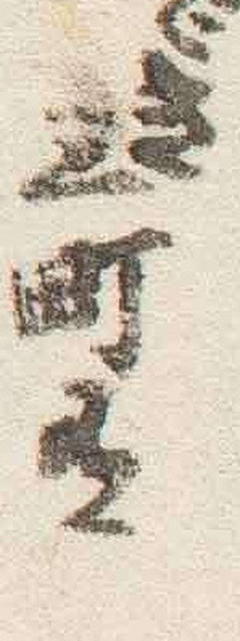三町有
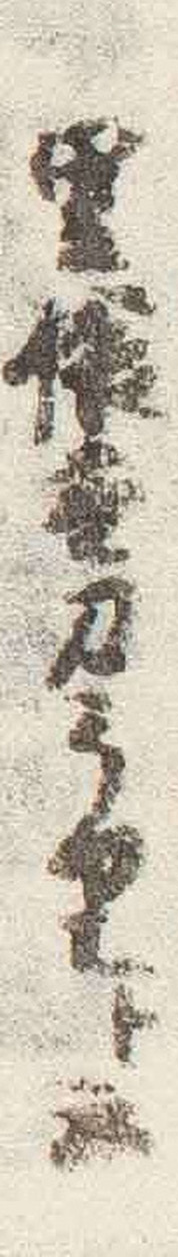里俗太刀うりト云
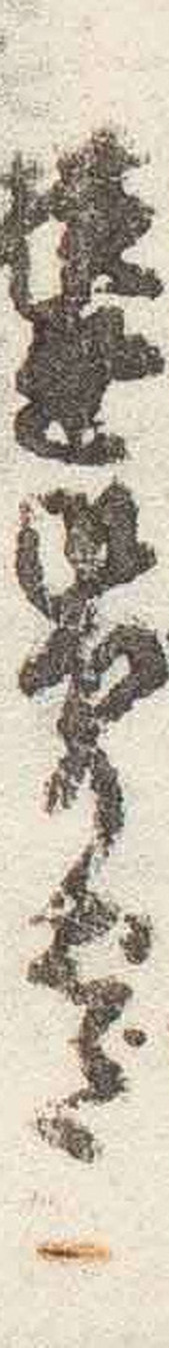横通御ほりばた
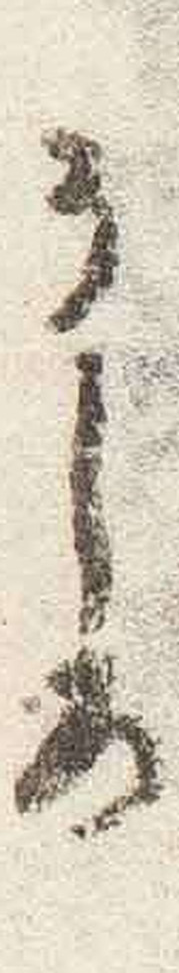うしろ
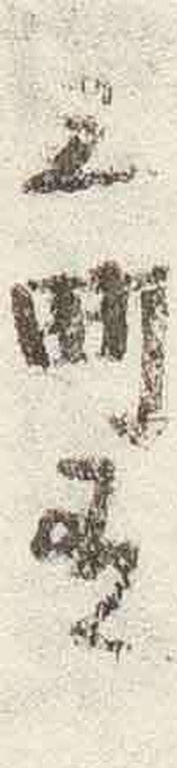三町有
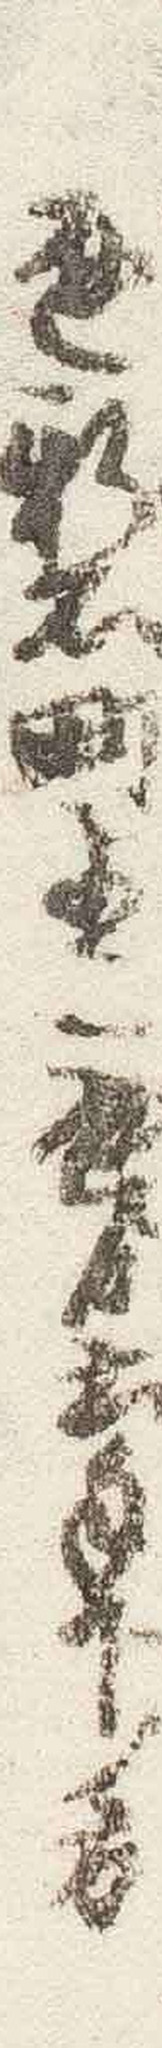通新石町よこ通ゟ土手下ノ方
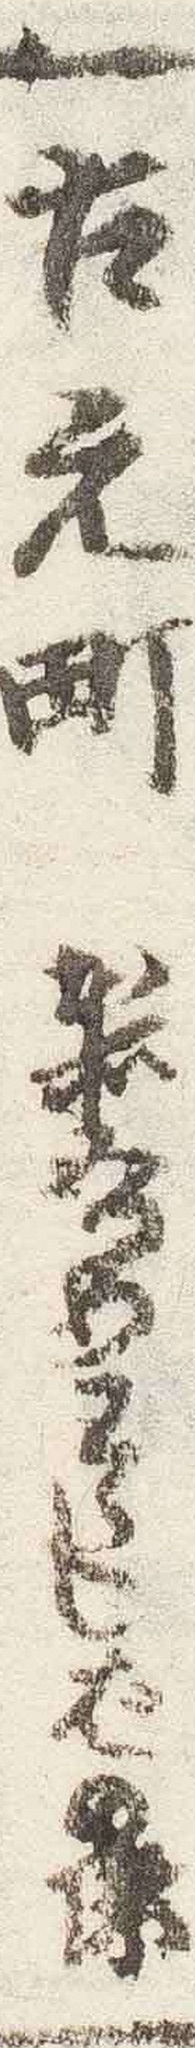古元町本所五ッめわたしばの際
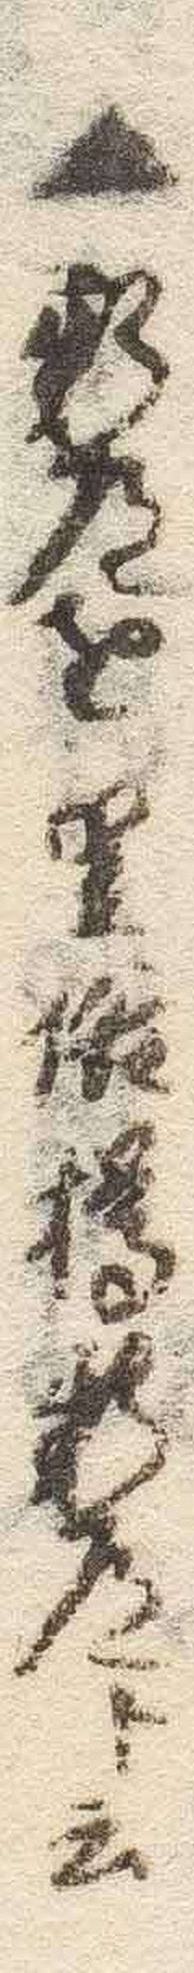▲新道を里俗樽新道ト云
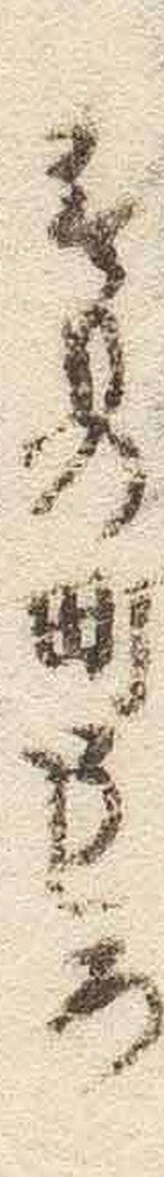青もの町うしろ
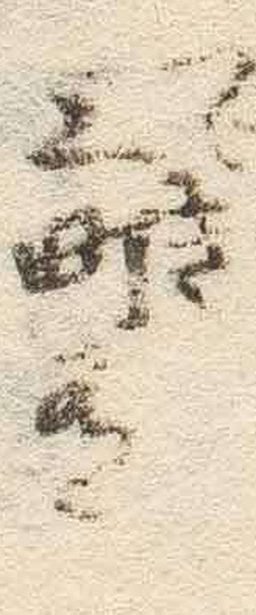三町有
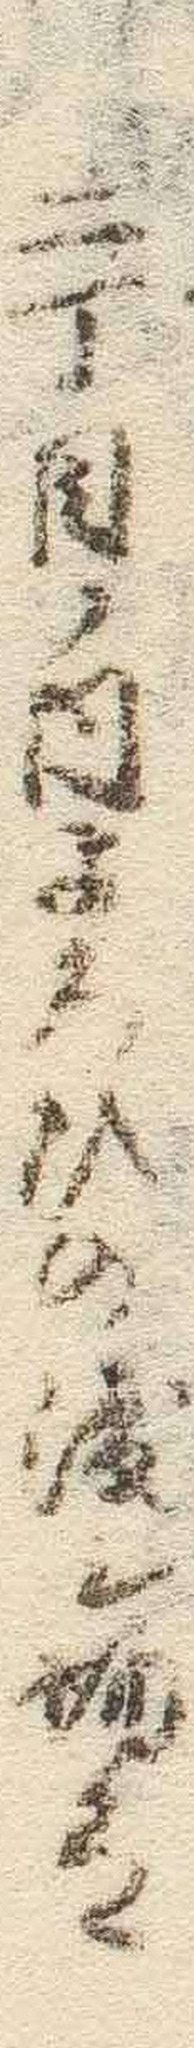二丁目ノ内よろひの渡シ場有
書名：江戸町独案内
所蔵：東京学芸大学附属図書館 国文学研究資料館
